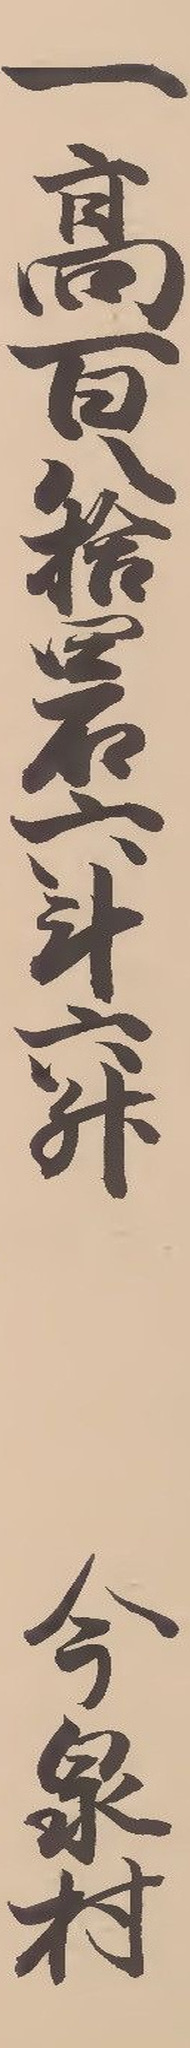一高百八拾四石六斗六升今泉村
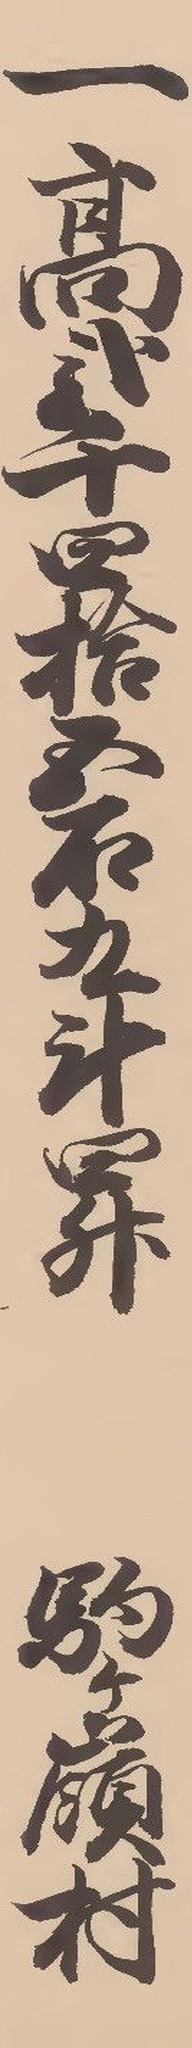一高弐千四拾五石九斗四升駒ヶ嶺村
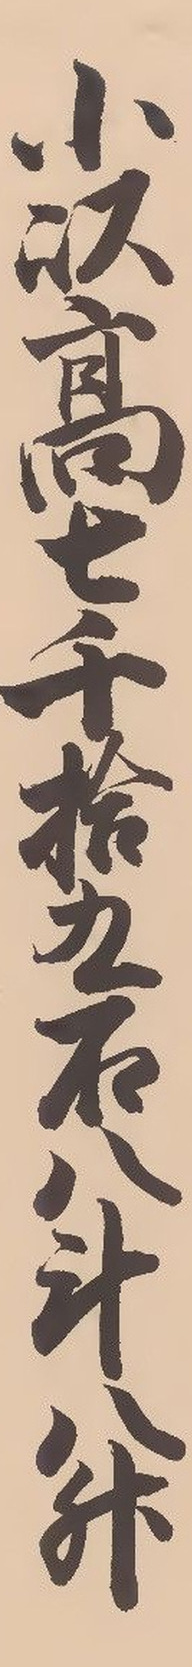小以高七千拾九石八斗八升

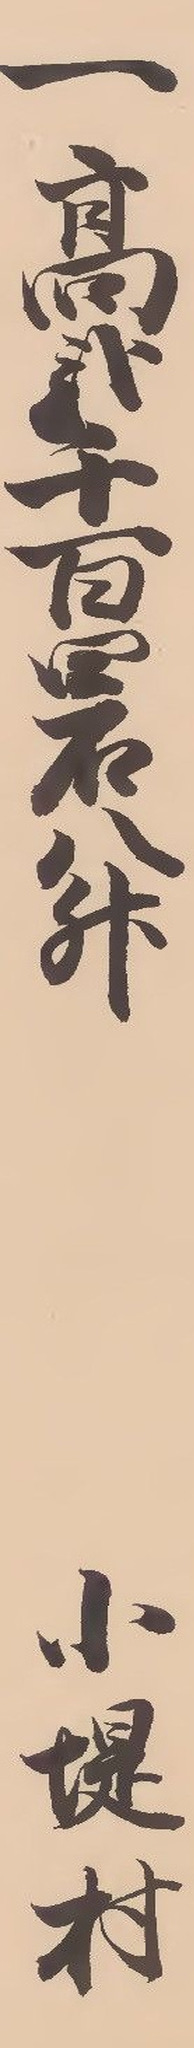一高弐千百四石八升小堤村
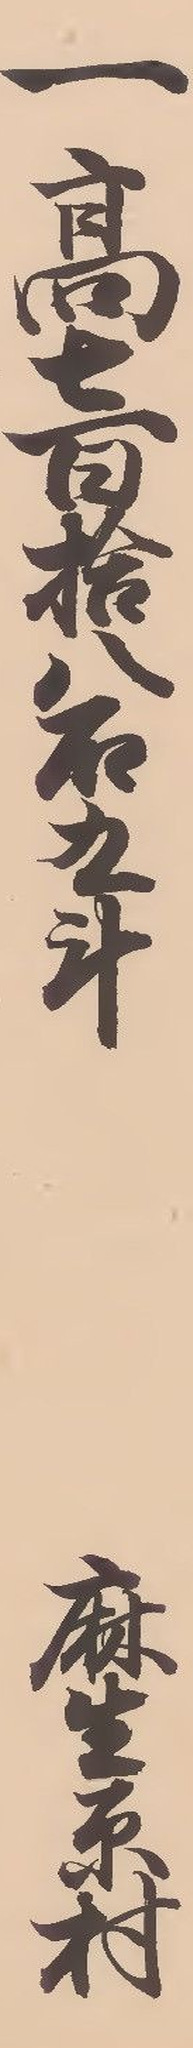一高七百拾八石九斗麻生原村
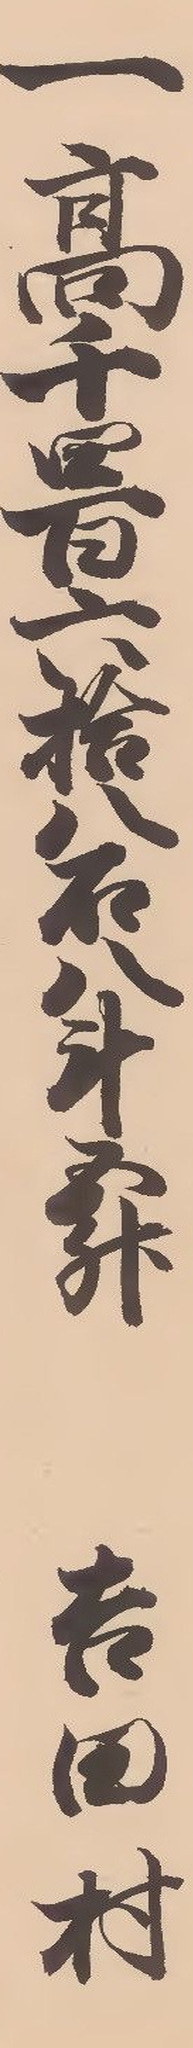一高千四百六拾八石八斗五升吉田村
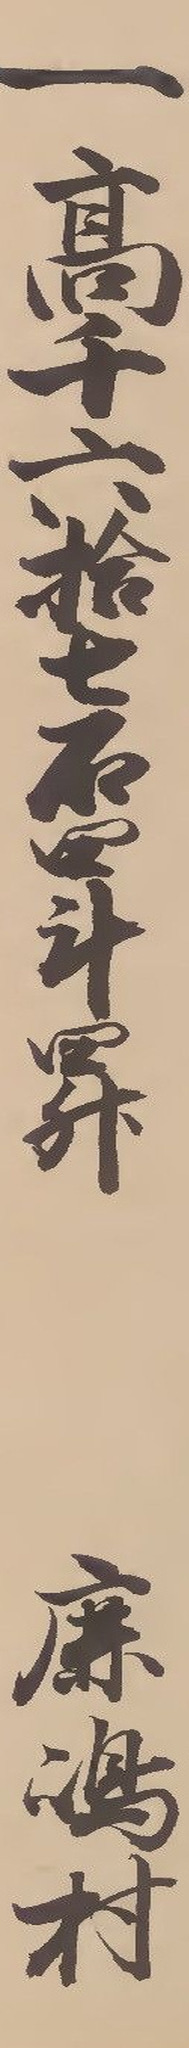一高千六拾七石四斗四升鹿島村
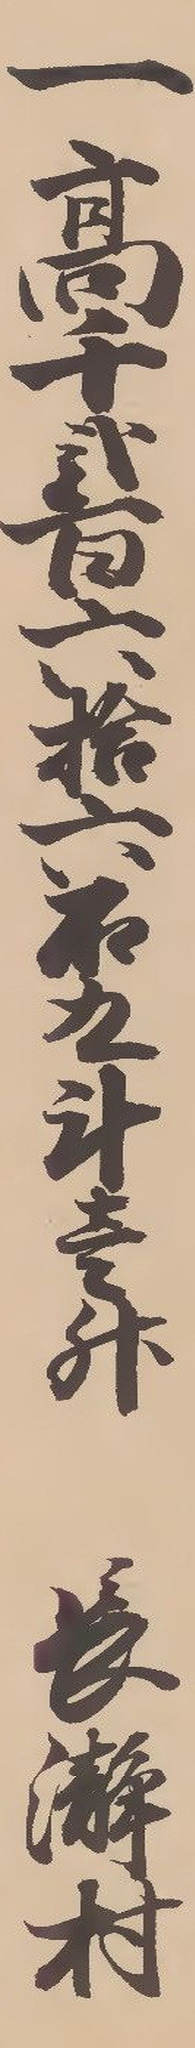一高千弐百六拾六石九斗壱升長瀞村
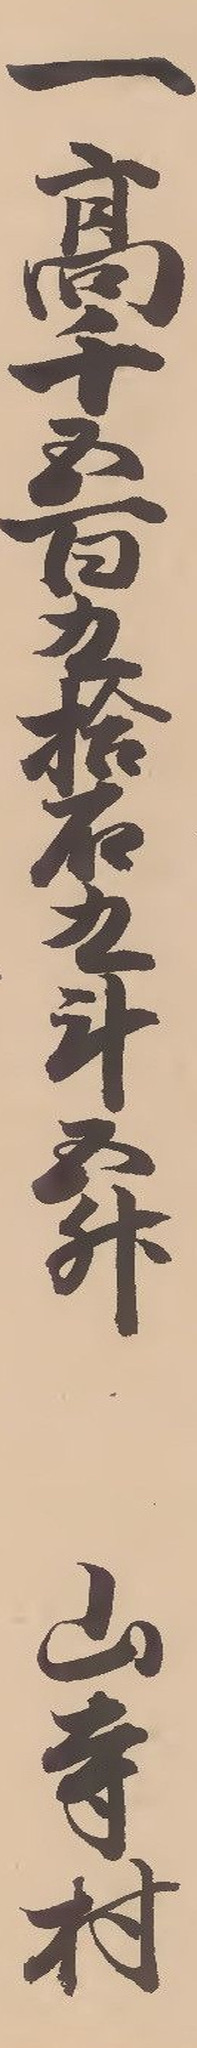一高千五百九拾石九斗五升山寺村
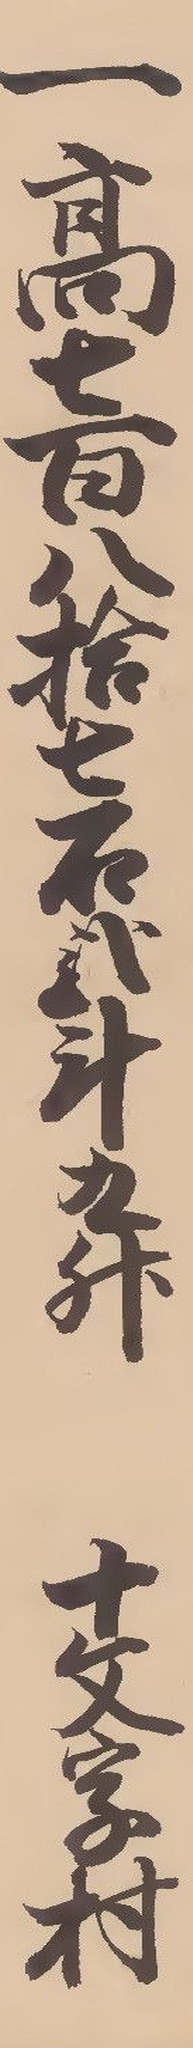一高七百八拾七石弐斗九升十文字村

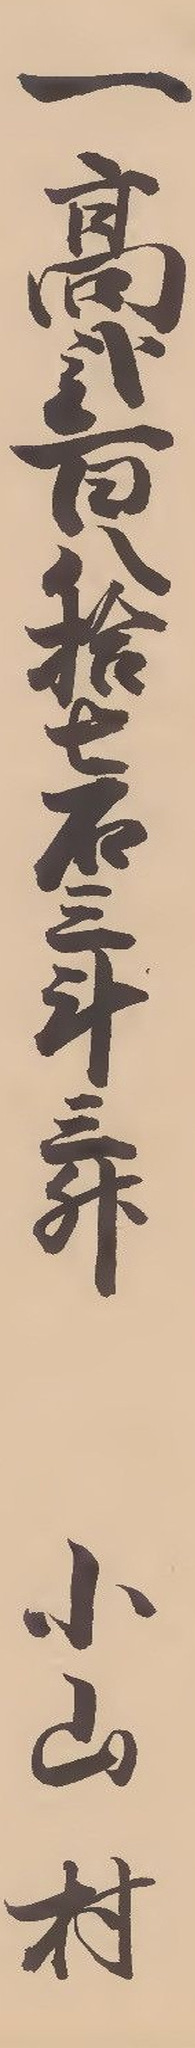一高弐百八拾七石三斗三升小山村
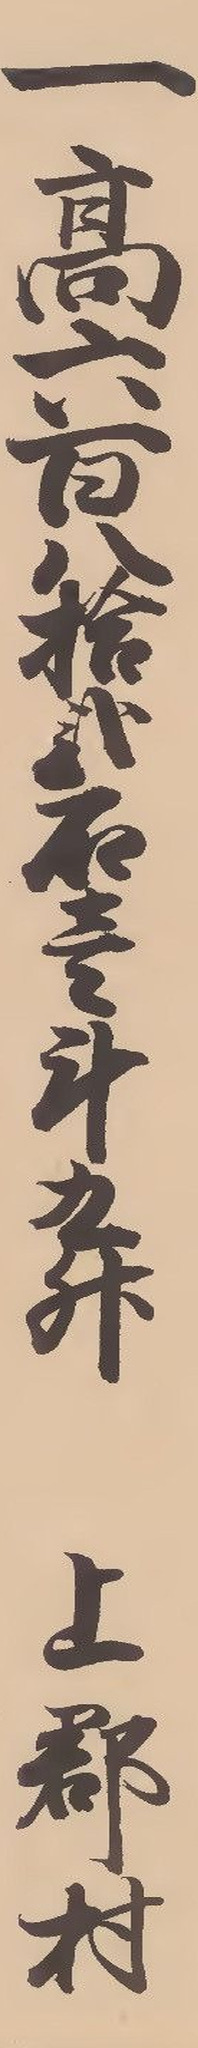一高六百八拾弐石壱斗九升上郡村
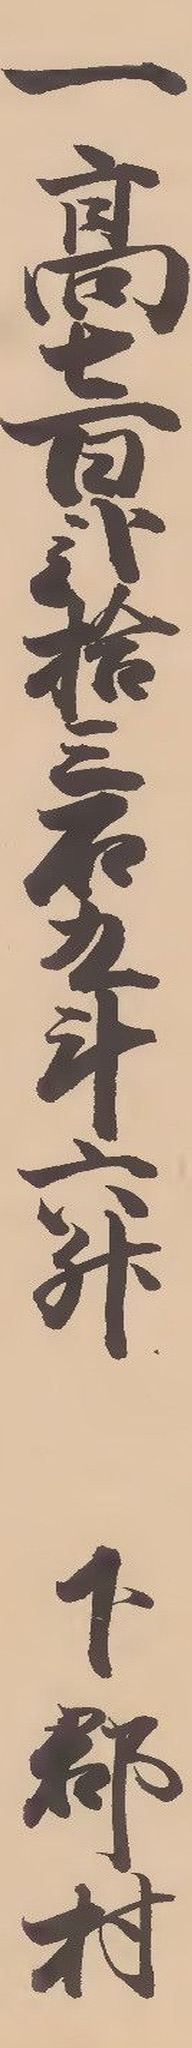一高七百弐拾三石九斗六升下郡村
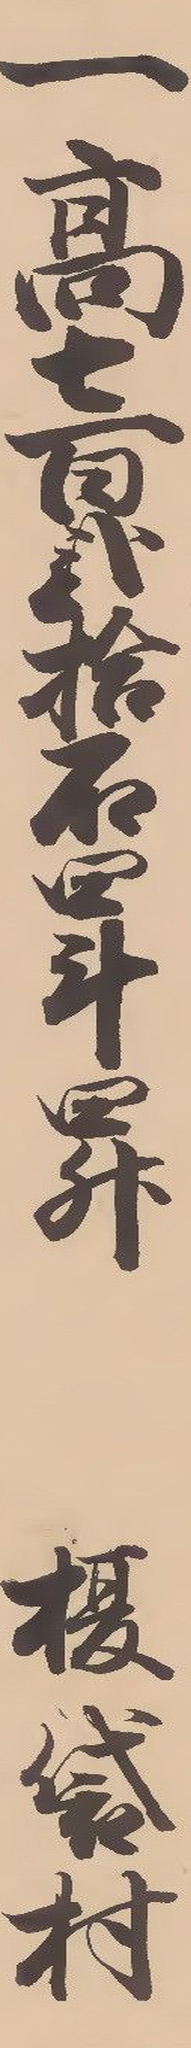一高七百弐拾石四斗四升榎袋村
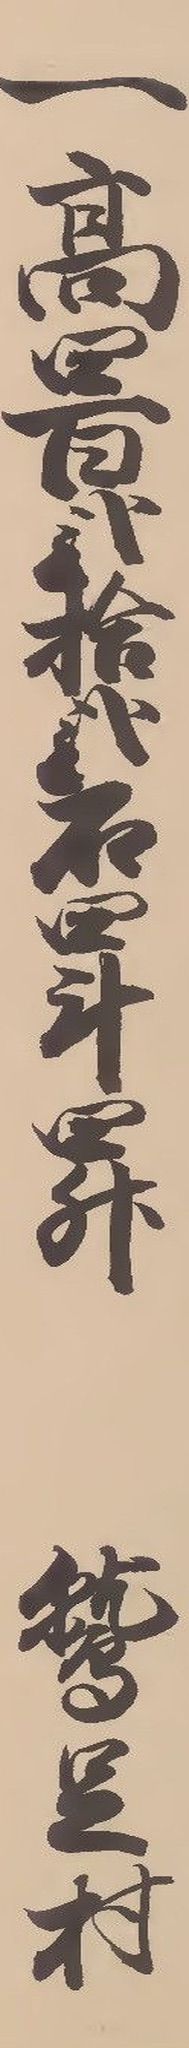一高四百弐拾弐石四斗四升鷲足村
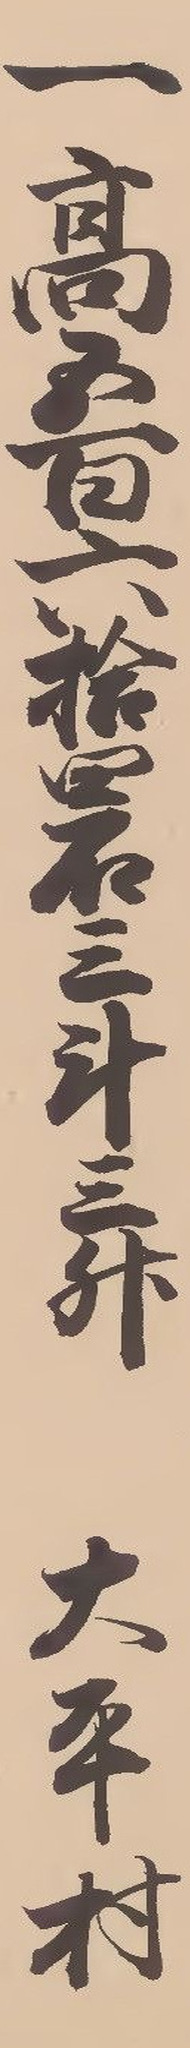一高五百六拾四石三斗三升大平村
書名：陸奥国郷帳　５
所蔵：国立公文書館 National Archives of Japan
